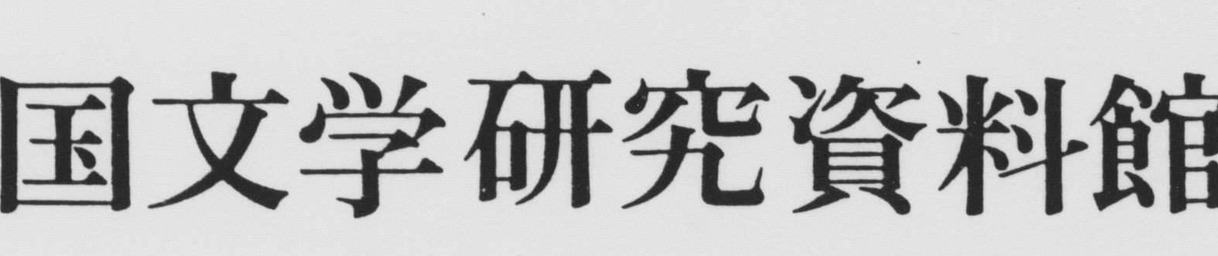国文学研究資料館
